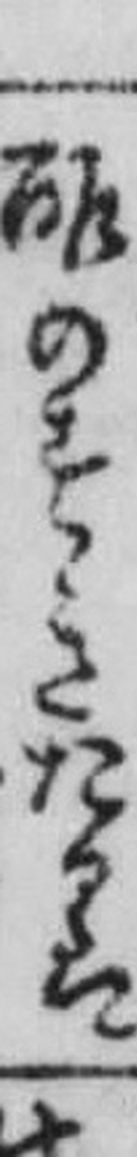酢のすきたるは
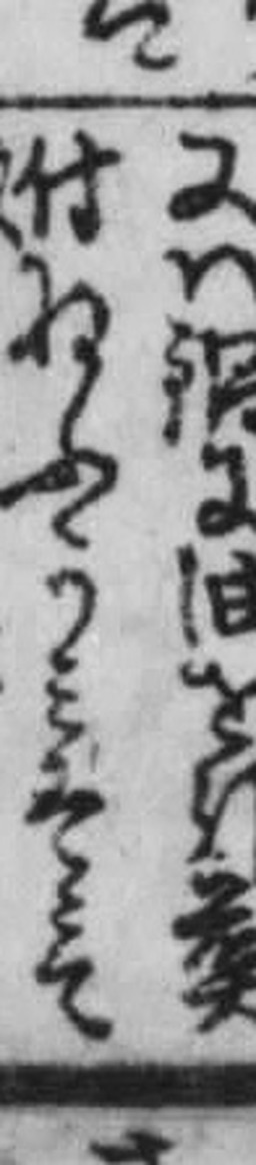付ねふかみそにて
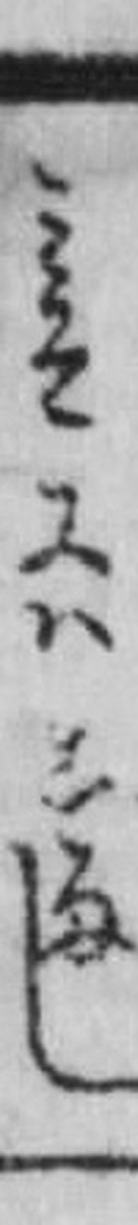みそ又はすまし
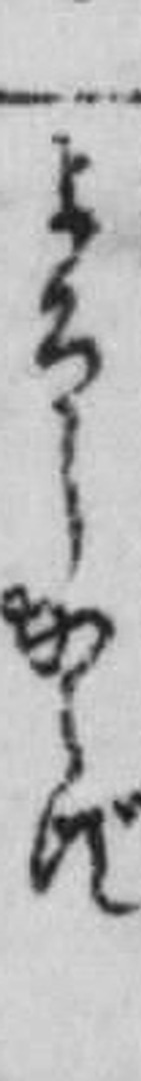よろしからず
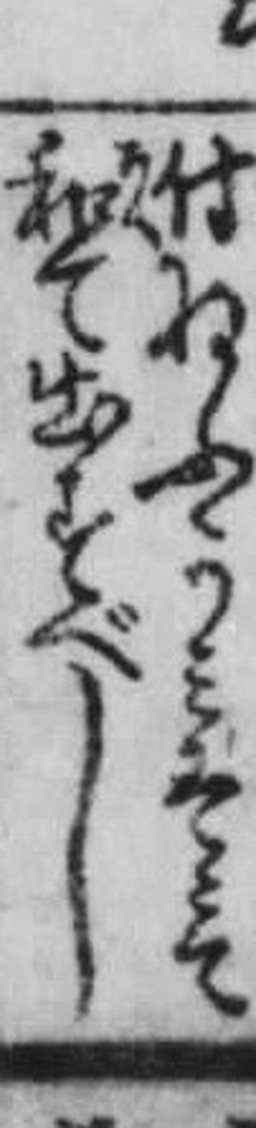和て出すべし
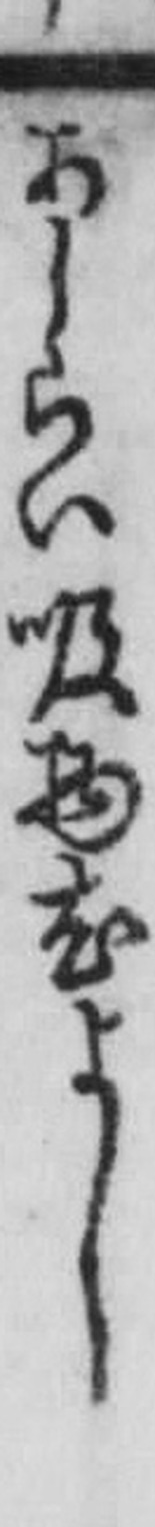あしらい吸物尤よし
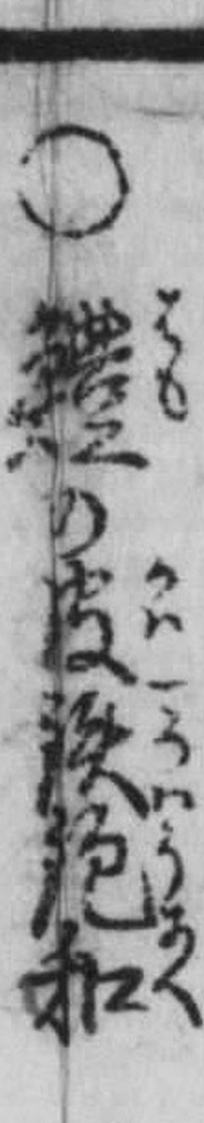○鱧の皮鉄砲和
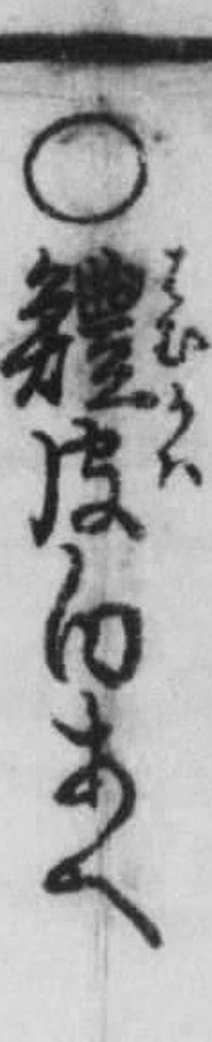○鱧皮白あへ
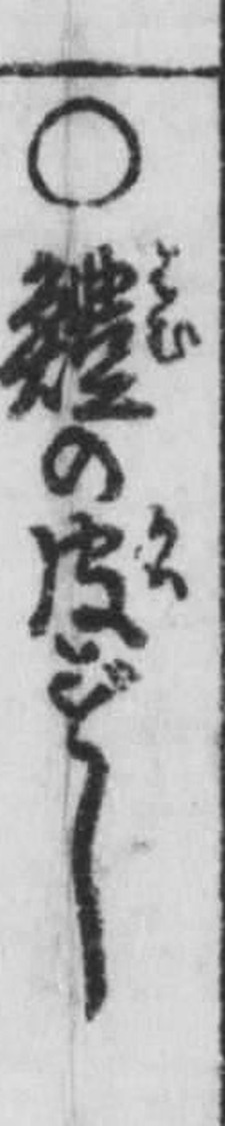○鱧の皮ずし
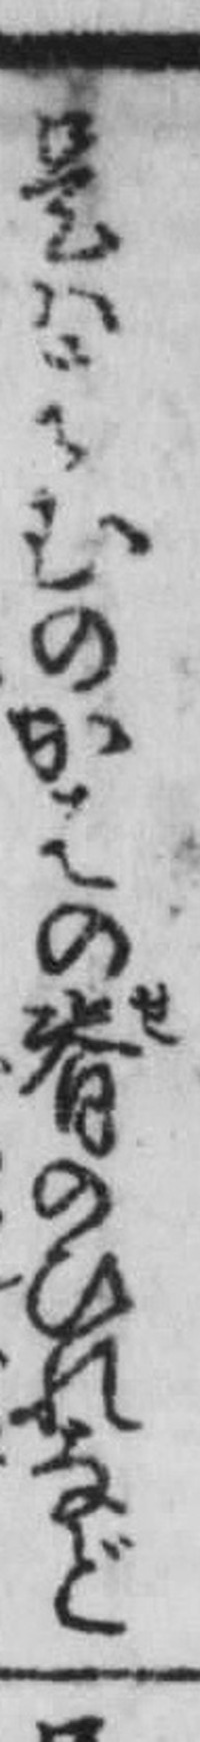是ははむのかはの背のひれなど
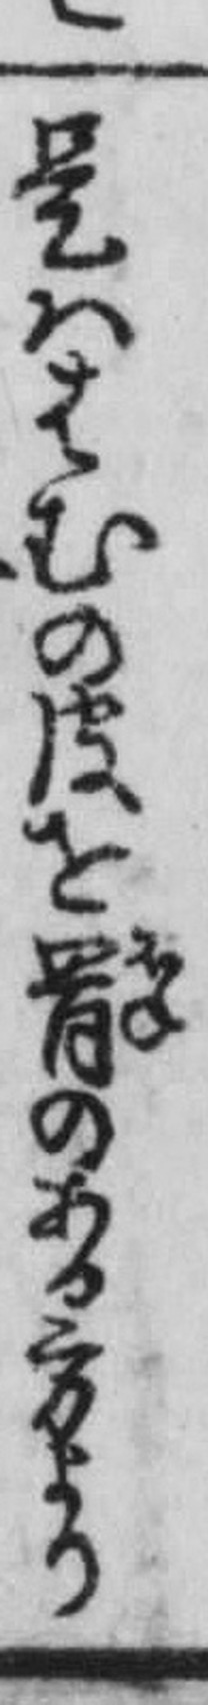是ははむの皮を骨のある方より
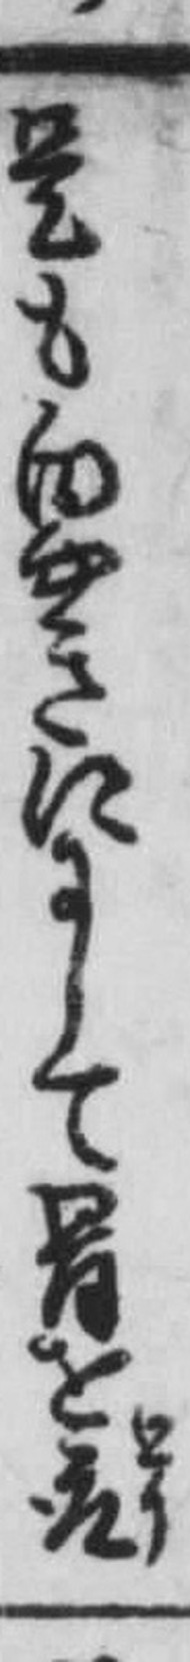是も白やきにして骨を取
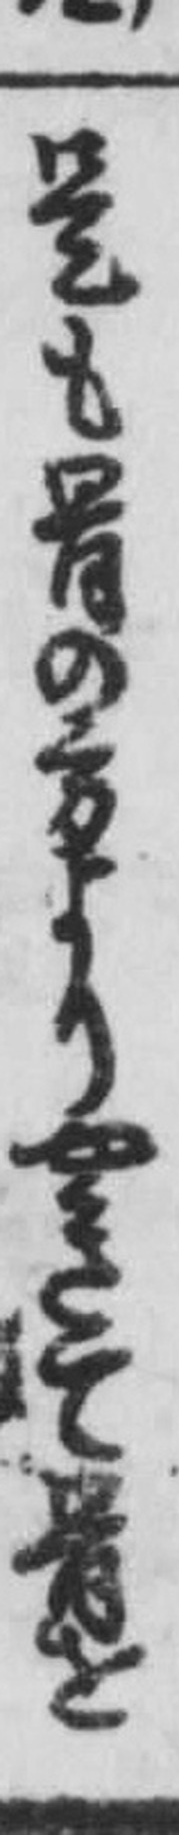是も骨の方よりやきて骨を
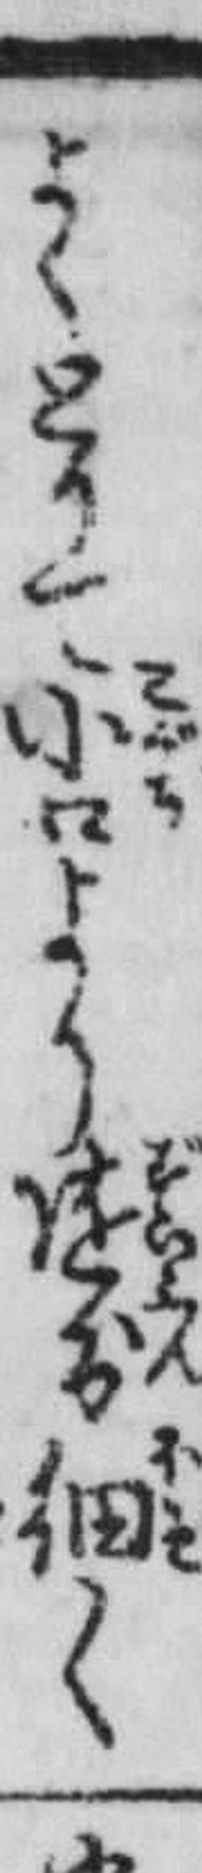よくとりて小口より随分細く
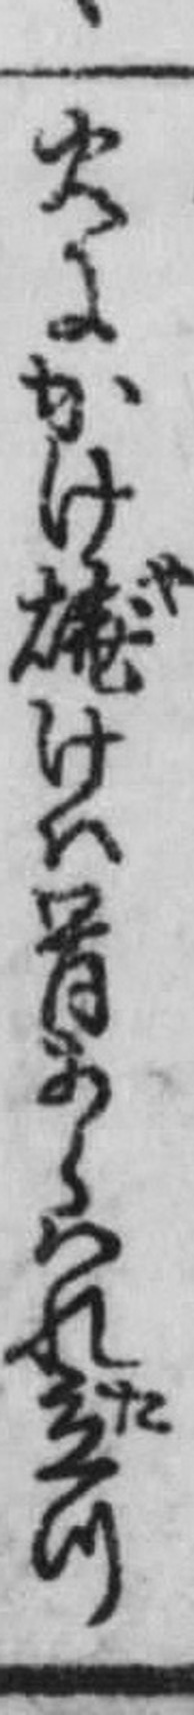火にかけ焼けは骨あらはれ立つ
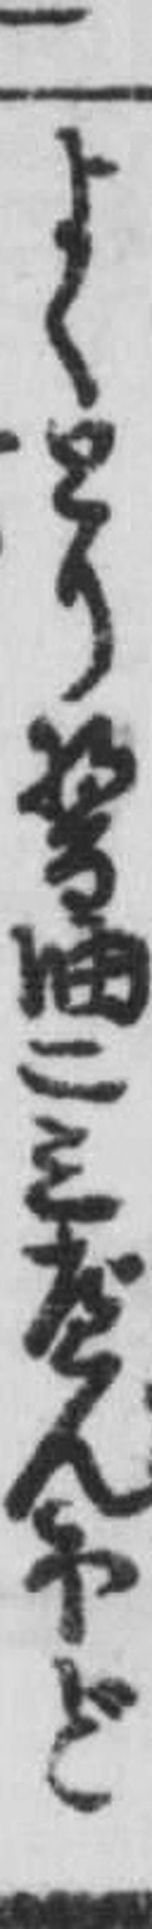よくとり醤油二三べんほど
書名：精進魚類間合料理/早速庖丁
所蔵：大阪府立大学学術情報センター 国文学研究資料館
